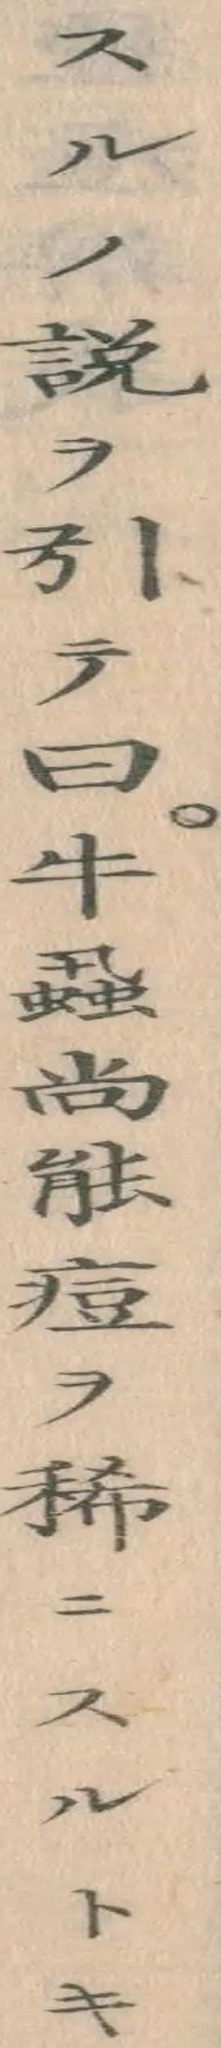スルノ説ヲ引テ曰。牛蝨尚能痘ヲ稀ニスルトキ
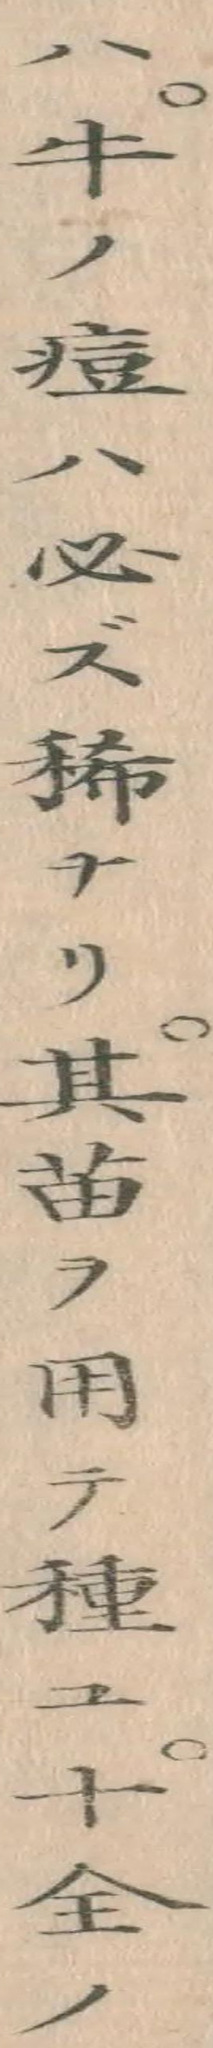ハ。牛ノ痘ハ必ズ稀ナリ。其苗ヲ用テ種ユ。十全ノ
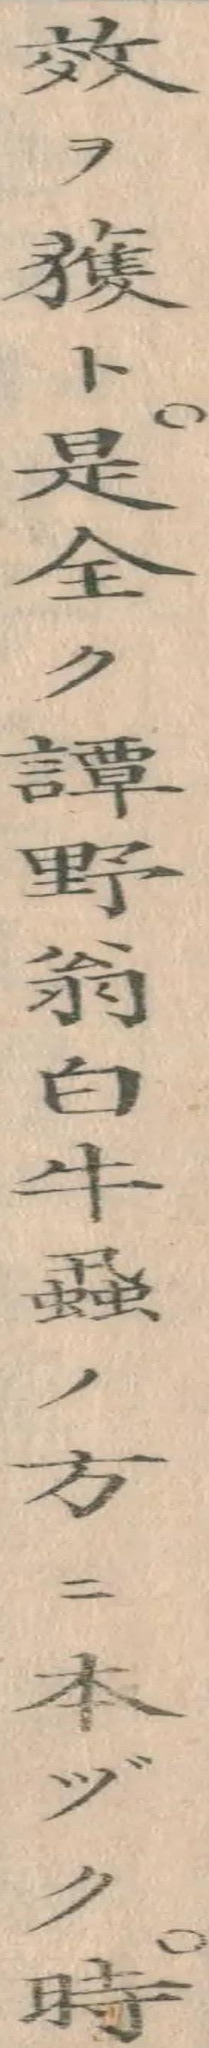效ヲ獲ト。是全ク譚野翁白牛蝨ノ方ニ本ヅク。時
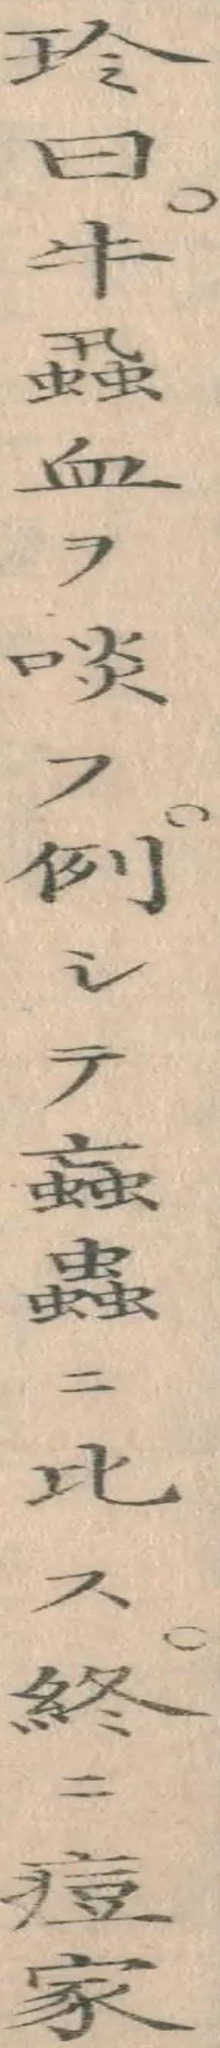玲曰。牛蝨血ヲ啖フ。例シテ虻虫ニ比ス。終ニ痘家
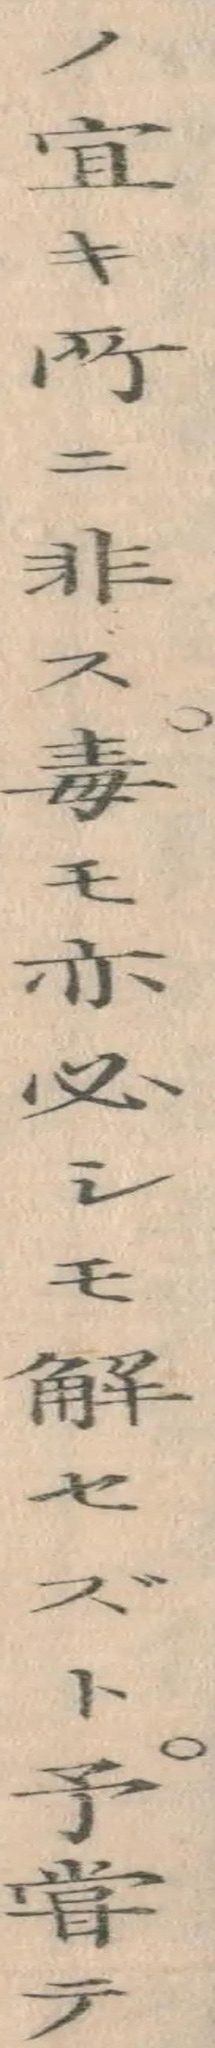ノ宜キ所ニ非ス。毒モ亦必シモ解セズト。予嘗テ
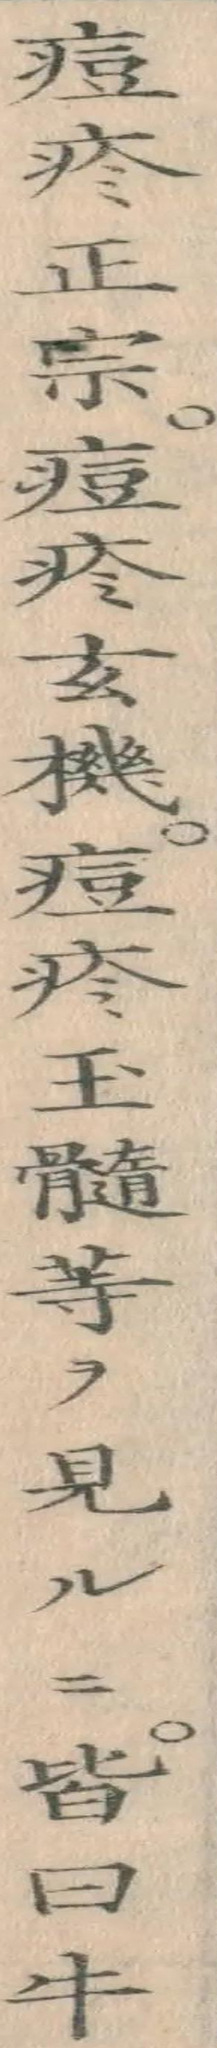痘疹正宗。痘疹玄機。痘疹玉髄等ヲ見ルニ。皆曰牛
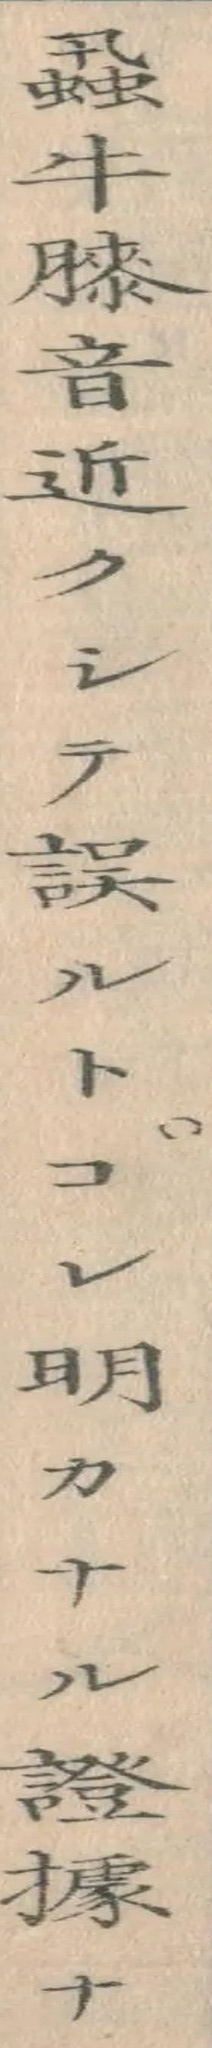蝨牛膝音近クシテ誤ルト。コレ明カナル証拠ナ
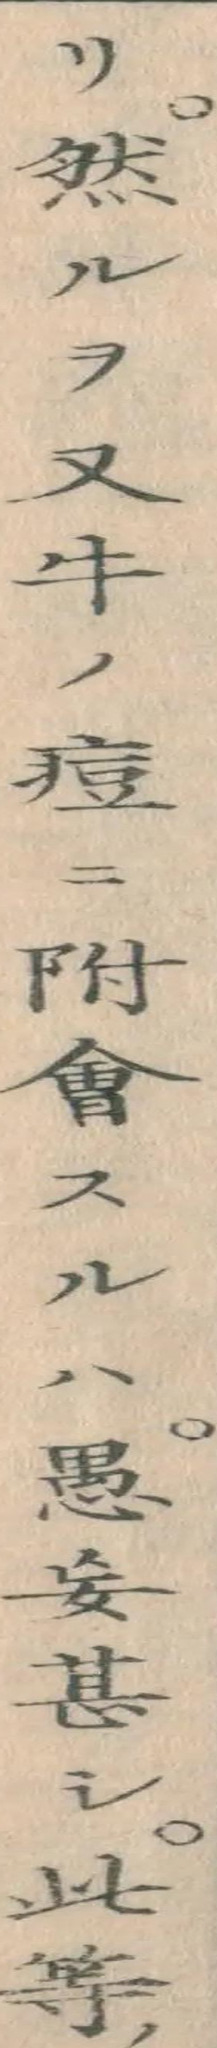リ。然ルヲ又牛ノ痘ニ附会スルハ。愚妄甚シ。此等
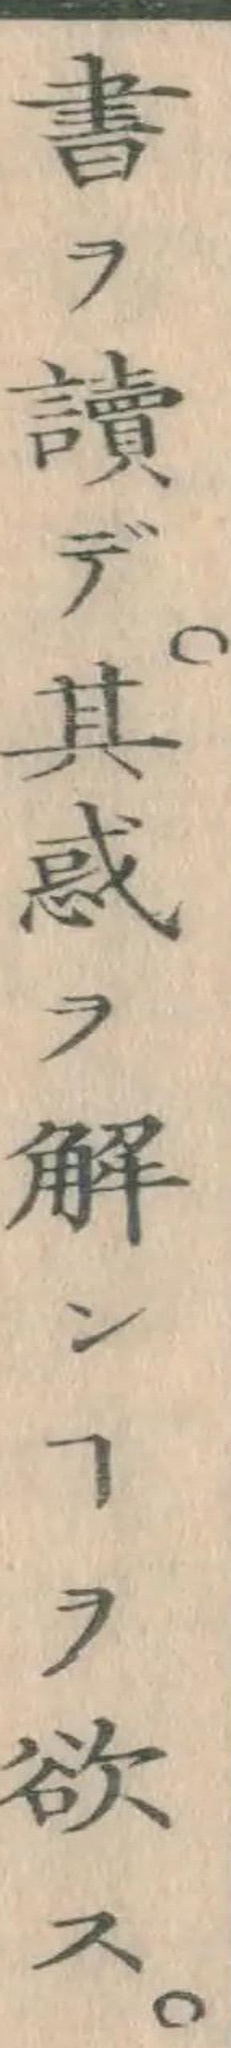書ヲ読デ。其惑ヲ解ンヿヲ欲ス。

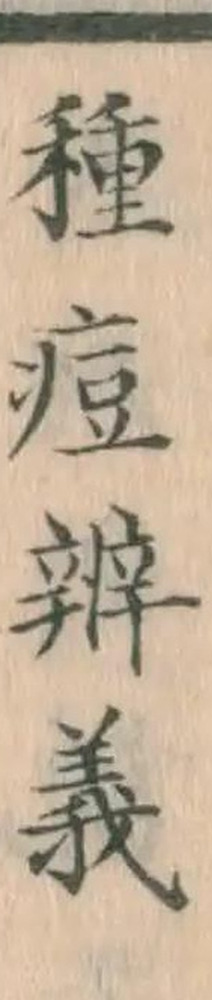種痘弁義
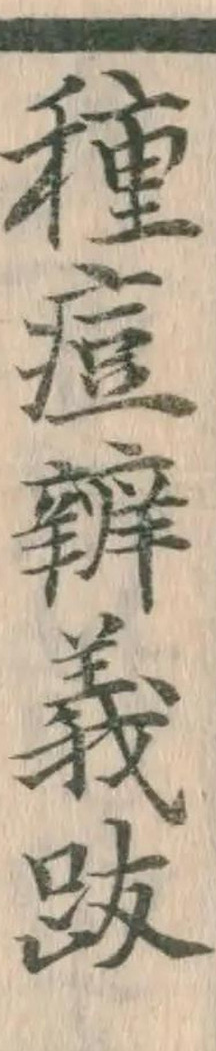種痘弁義跋
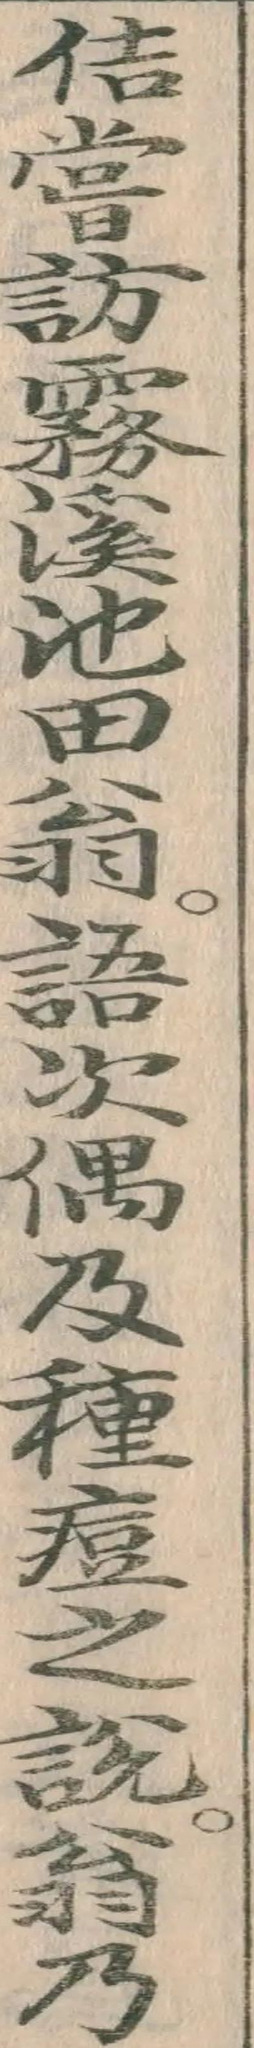佶嘗訪霧渓池田翁。語次偶及種痘之説。翁乃
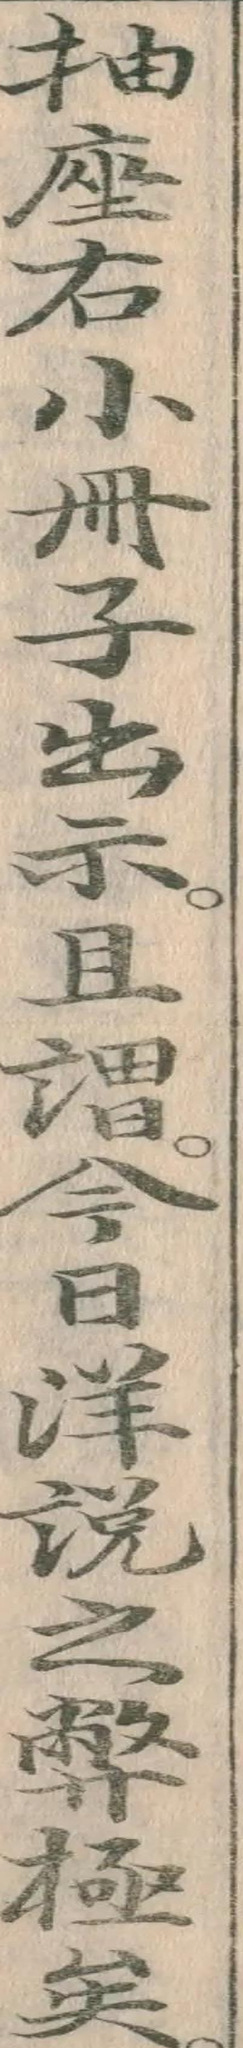抽座右小冊子出示。且謂。今日洋説之弊極矣。
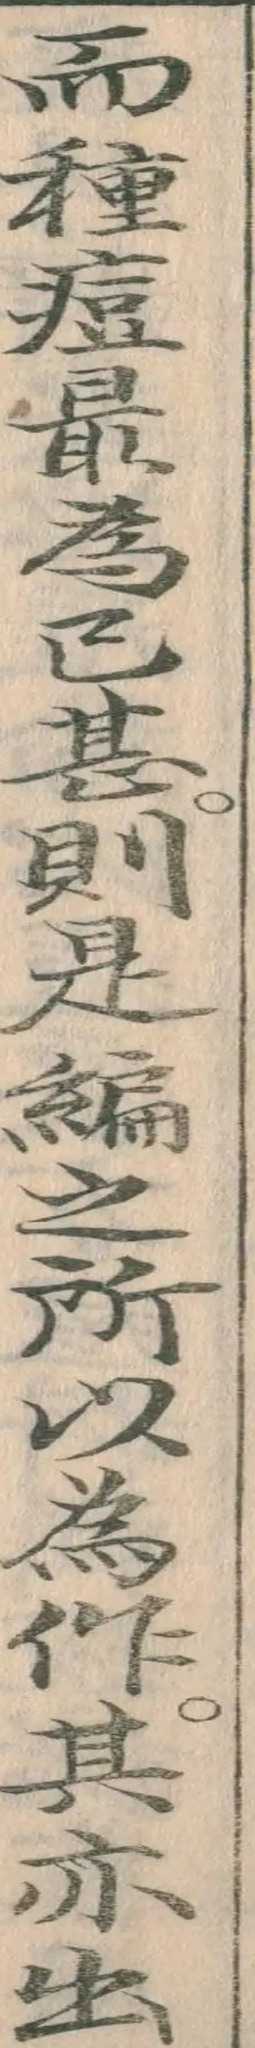而種痘最為已甚。則是編之所以為作。其亦出
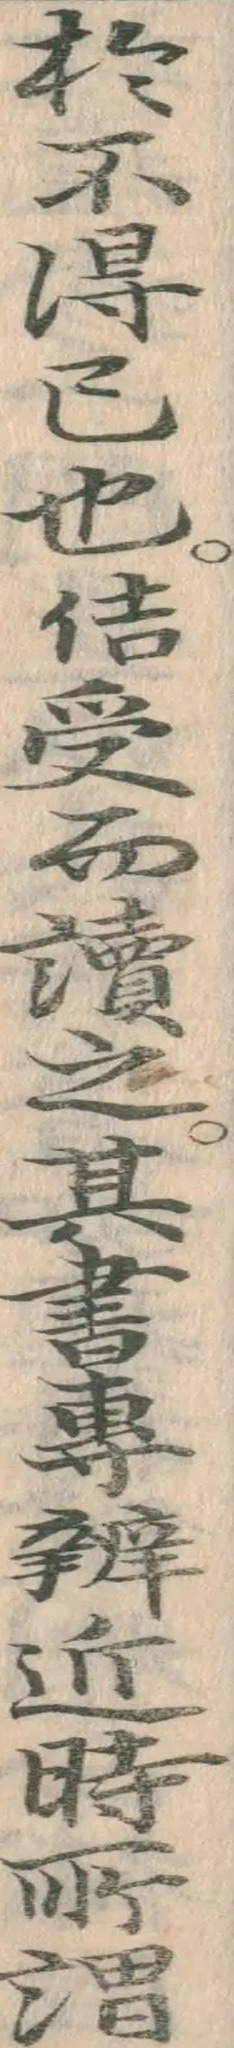於不得已也。佶受而読之。其書専弁近時所謂
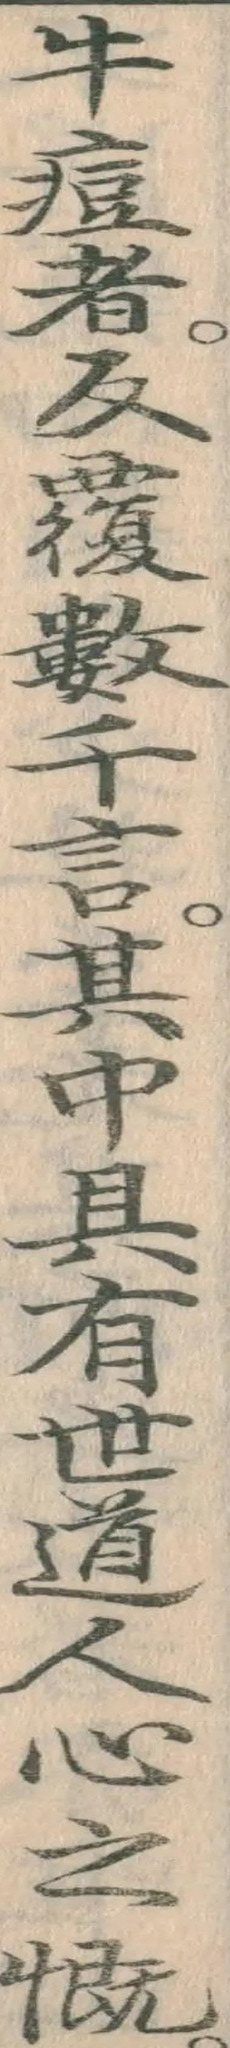牛痘者。反覆数千言。其中具有世道人心之慨。
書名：種痘弁義
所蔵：国立国会図書館 National Diet Library, JAPAN
